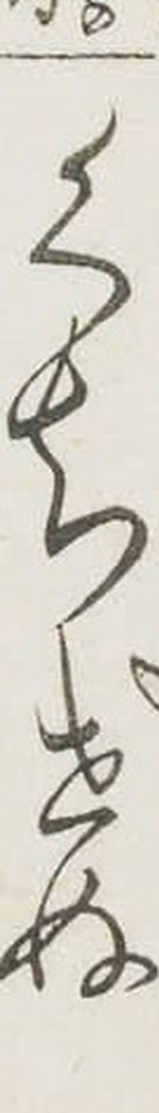くちせぬ
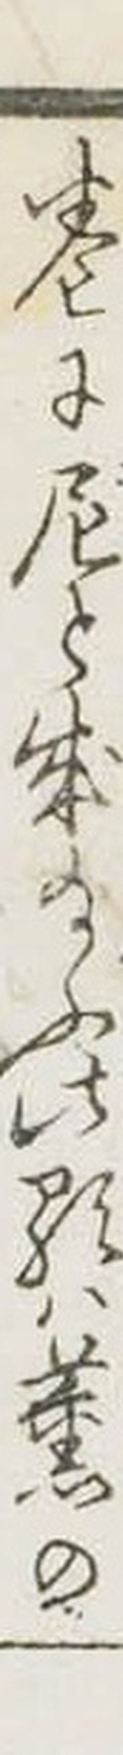巻に尼と成給ふ此歌は薫の
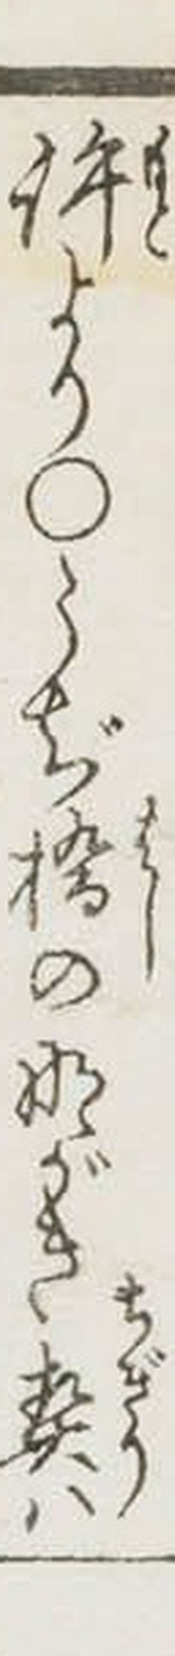許より○うぢ橋のながき契は
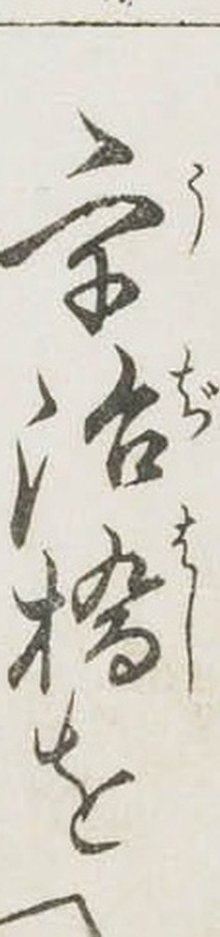宇治橋を
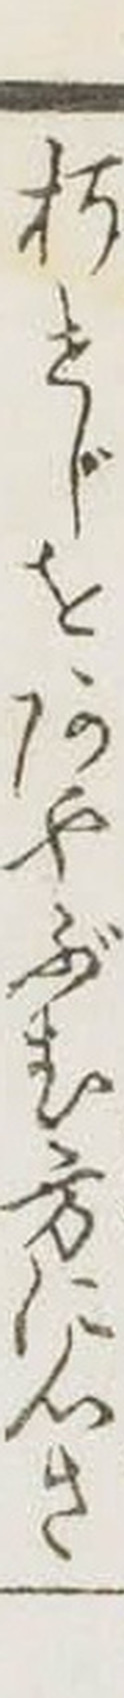朽せじをあやぶむ方に心さ
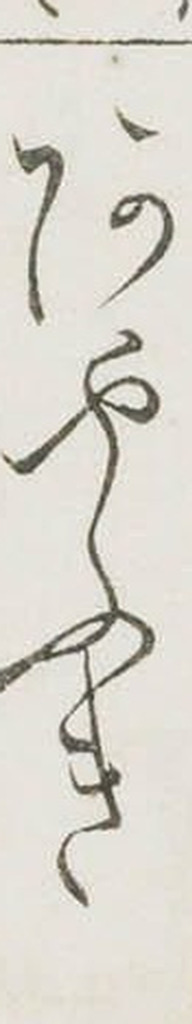あやふき
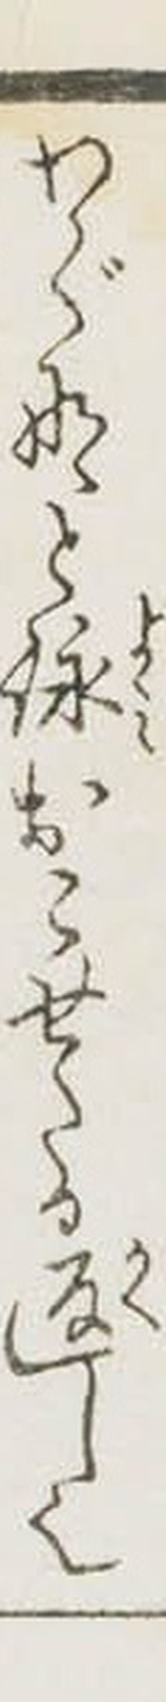わぐなと詠おこせたる返し也
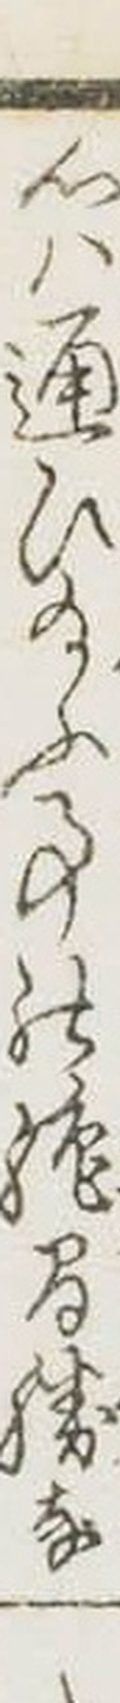心は通ひ給ふ事の絶間勝な
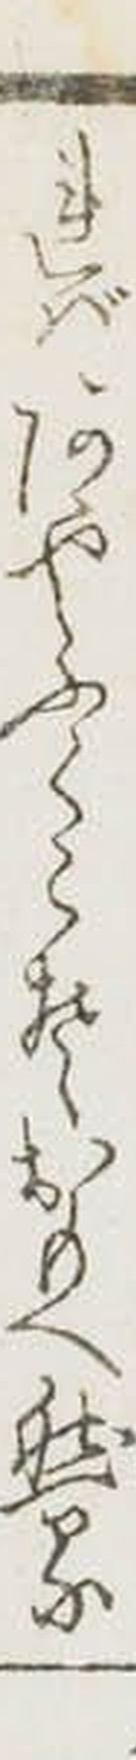ればあやふくこそおもへ然る
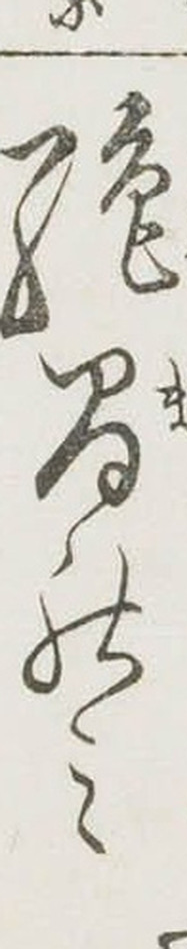絶間のみ
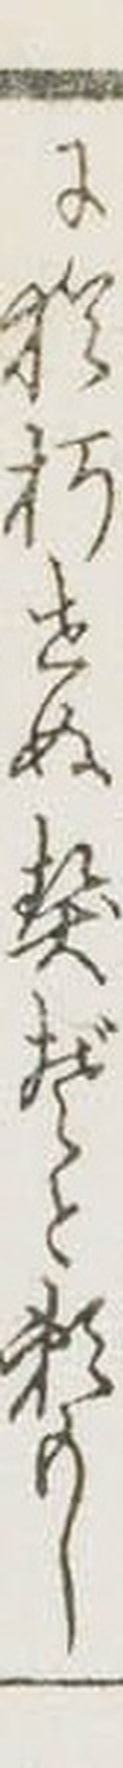に猶朽せぬ契ぞと頼もし
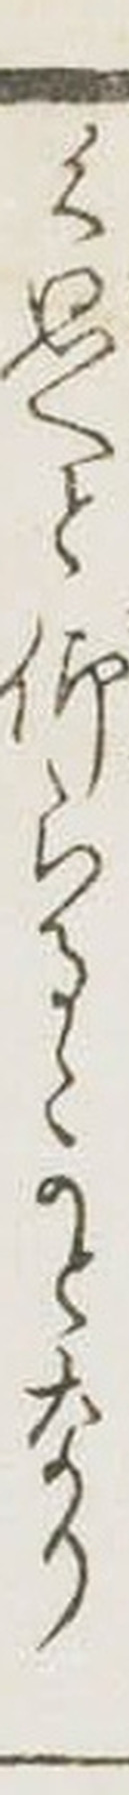く思へと仰らるゝかとなり
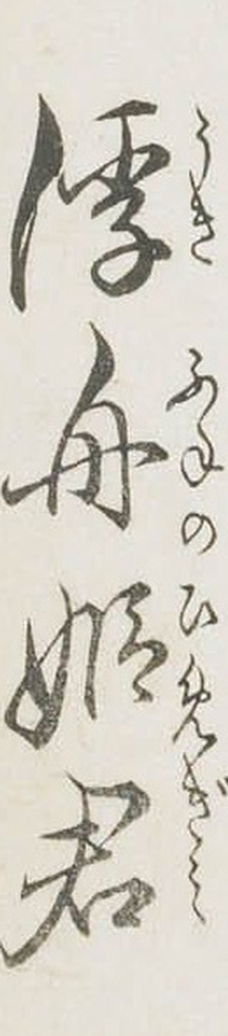浮舟姫君
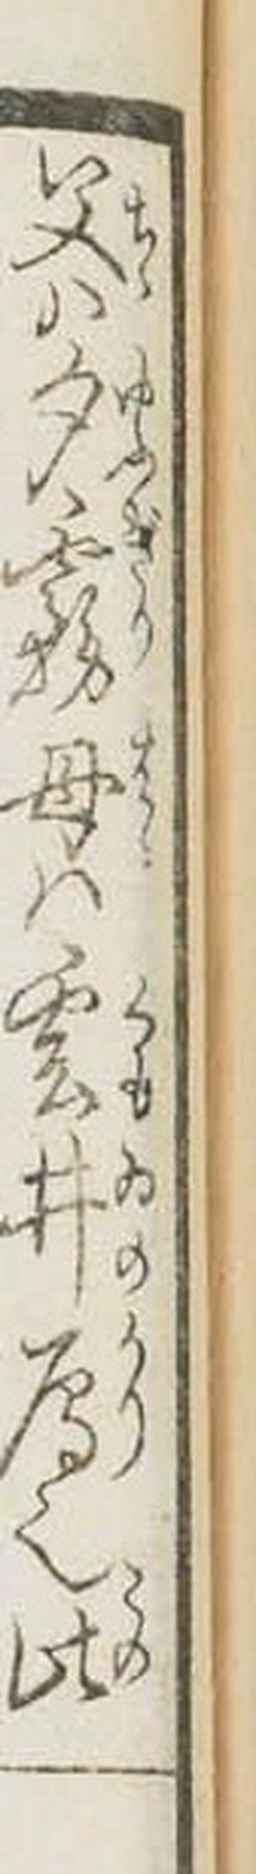父は夕霧母は雲井鳫也此
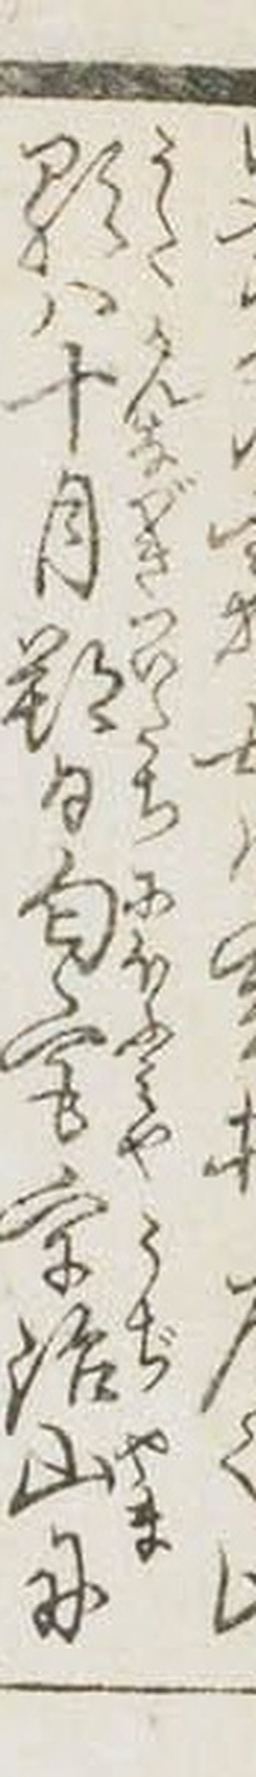歌は十月朔日匂宮宇治山に
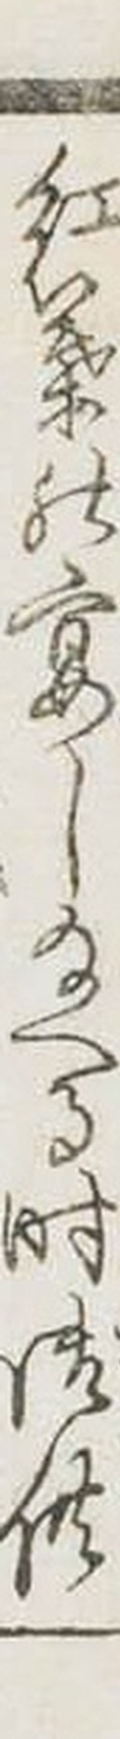紅葉の宴し給へる時御供
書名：源氏百人一首
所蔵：東京学芸大学教育コンテンツアーカイブ
